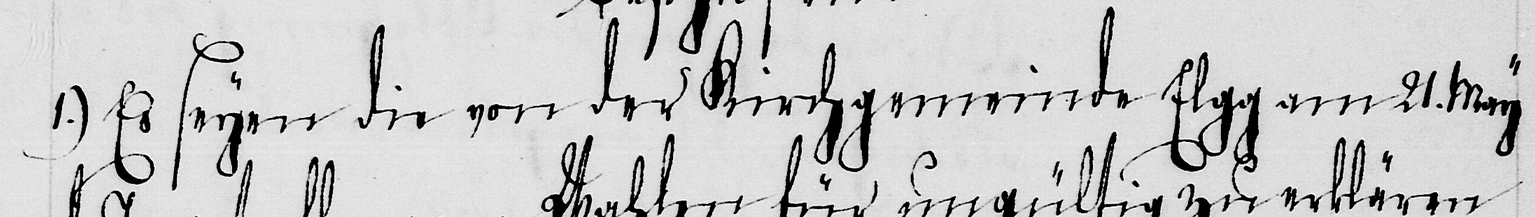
1.) Es seyen die von der Kirchgemeinde Elgg am 21. May
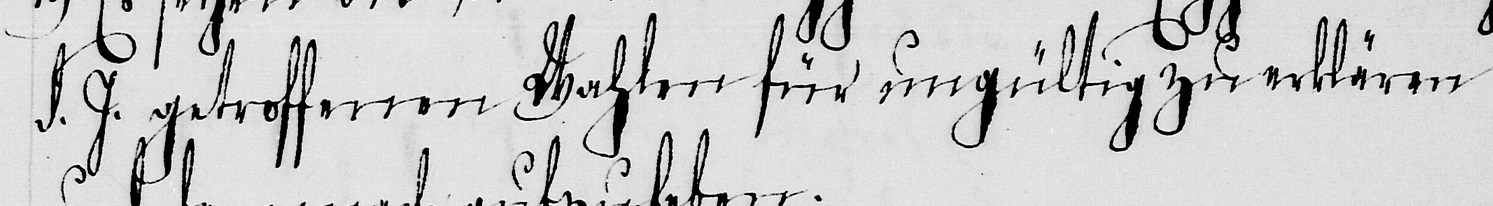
d. J. getroffenen Wahlen für ungültig zu erklären
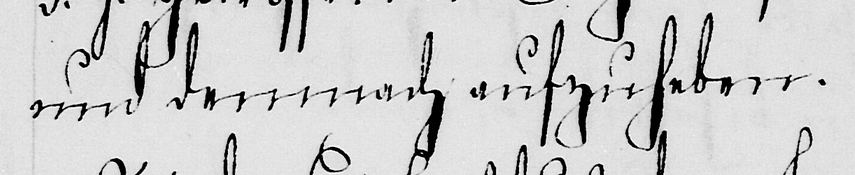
und demnach aufzuheben.
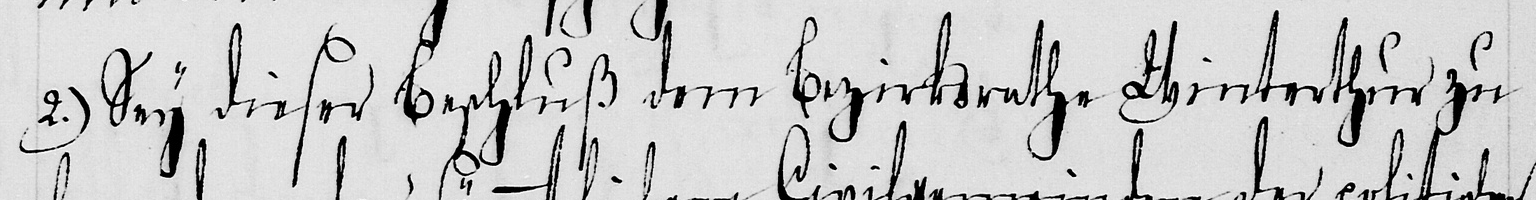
2.) Sey dieser Beschluß dem Bezirksrathe Winterthur zu
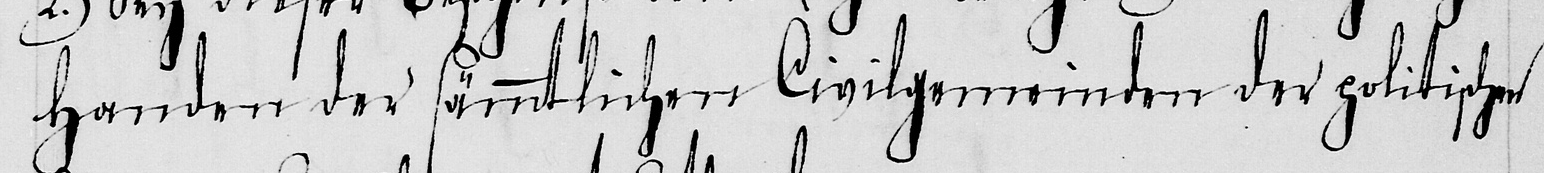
Handen der sämmtlichen Civilgemeinden der politisch¬
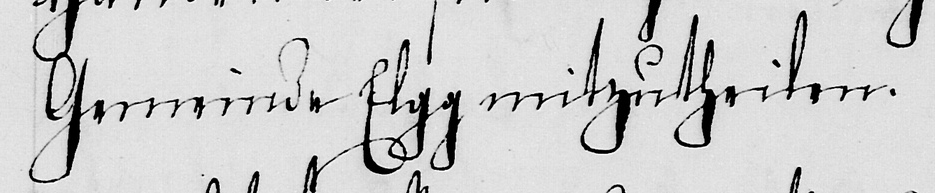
Gemeinde Elgg mitzutheilen.
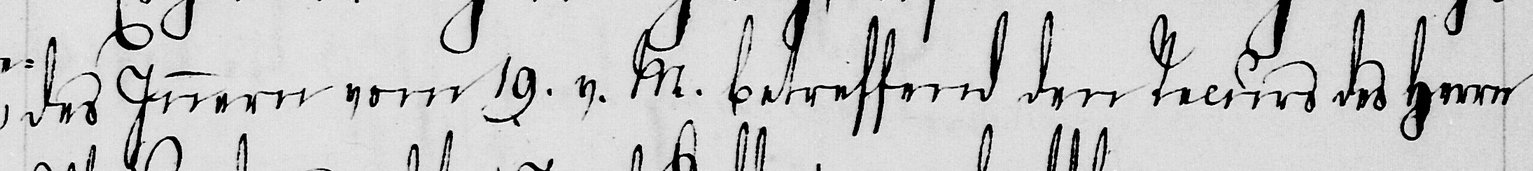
des Innern vom 19. v. M. betreffend den Recurs des Herrn
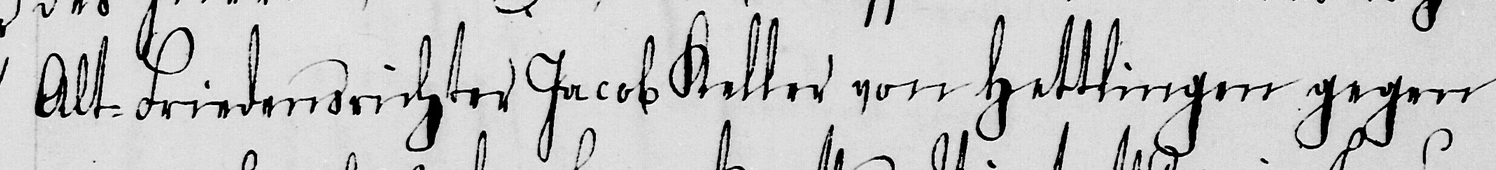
Alt-Friedensrichter Jacob Keller von Hettlingen gegen
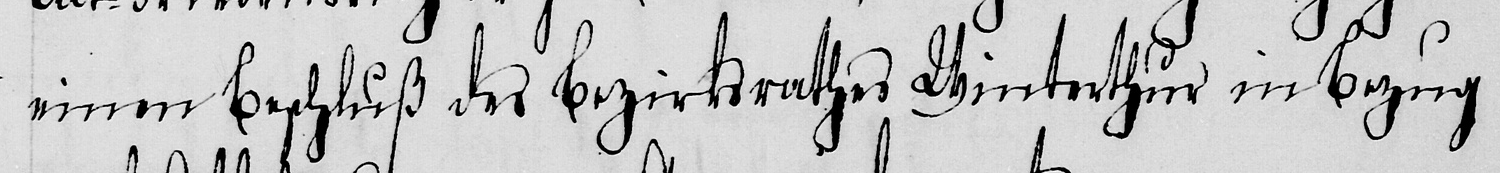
einen Beschluß des Bezirksrathes Winterthur in Bezug
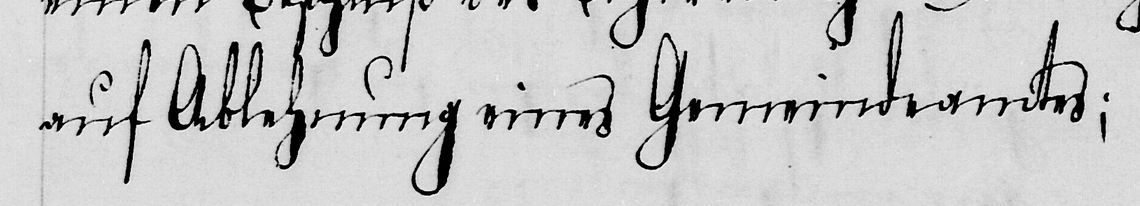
auf Ablehnung eines Gemeindeamtes;
